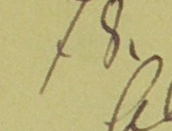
78
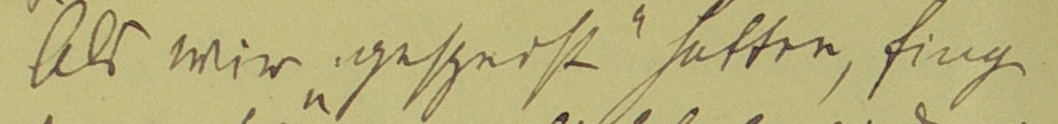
Als wir „ gespeist“ hatten, fing
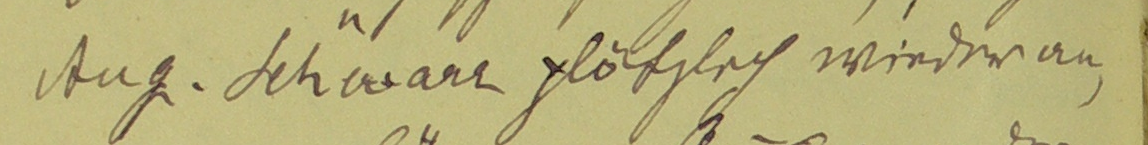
Aug. Schwarz plötzlich wieder an,
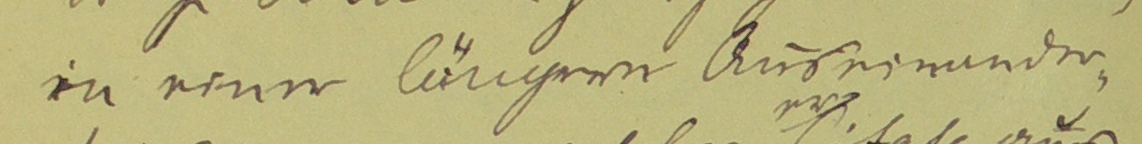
in einer längeren Auseinander¬
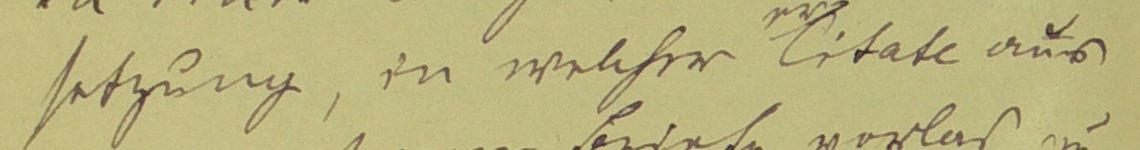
setzung, in welcher er Citate aus
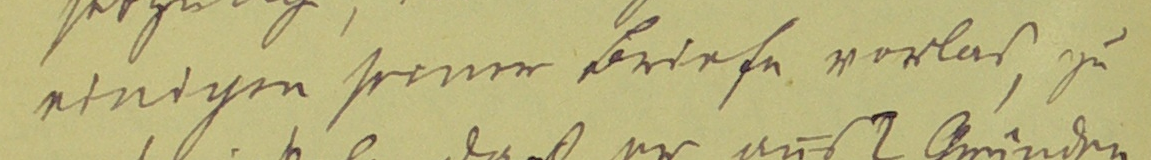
einigen seiner Briefe vorlas, zu
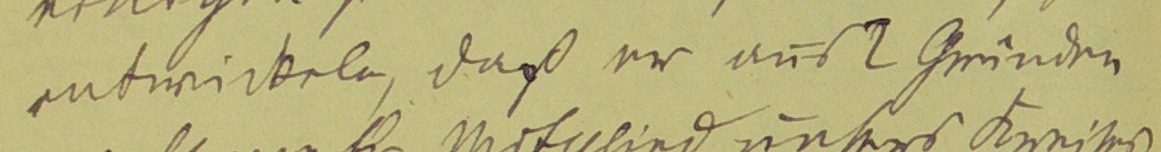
entwickeln, daß er aus 2 Gründen
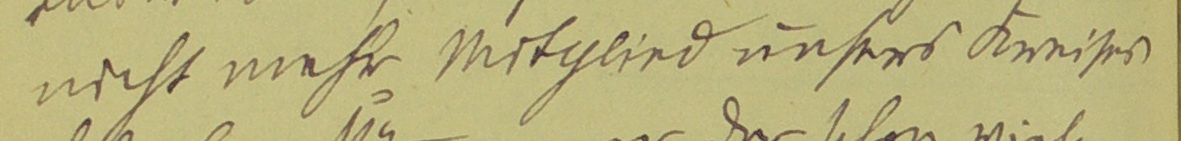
nicht mehr Mitglied unseres Kreises
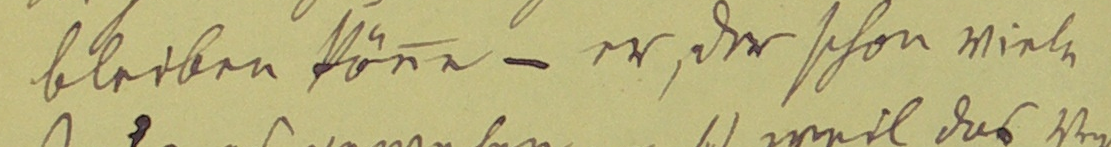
bleiben könne. -er, der schon viele
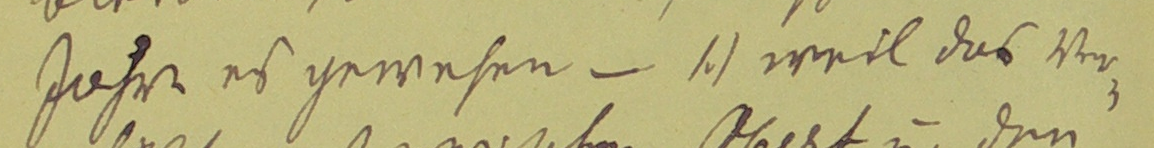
Jahre es gewesen-. Weil das Ver¬
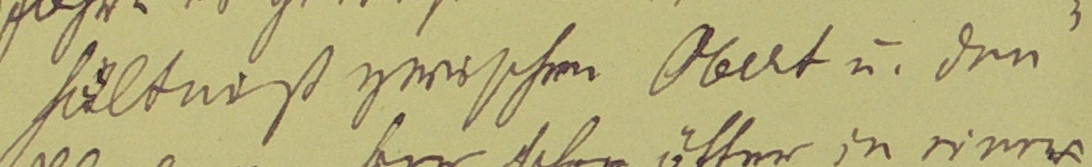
hältnis zwischen Obert und den
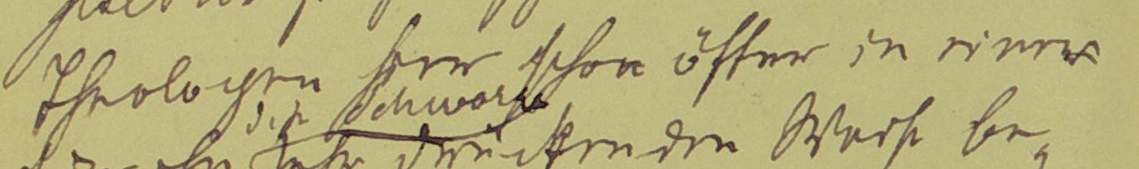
Theologen hier schon öfter in einer
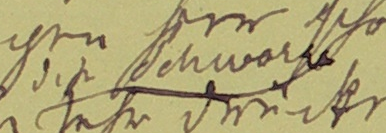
( Schwarz)
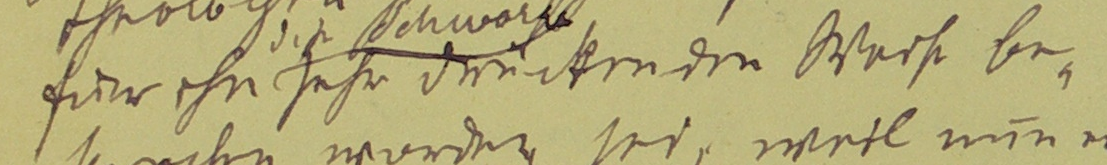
für ihn -sehr drückenden Weise be¬
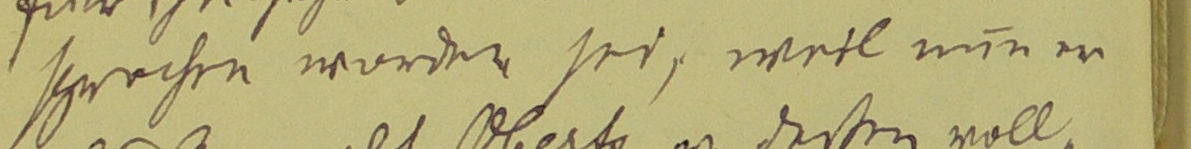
sprochen worden sei, weil nun er
